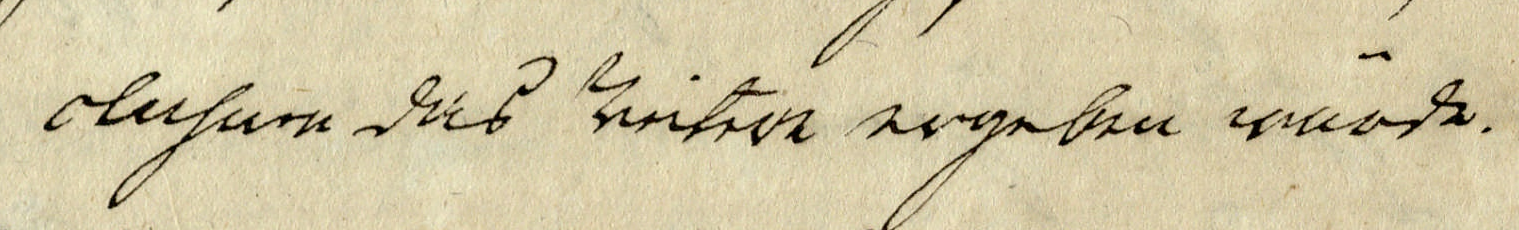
clusum das Weitere ergeben würde.
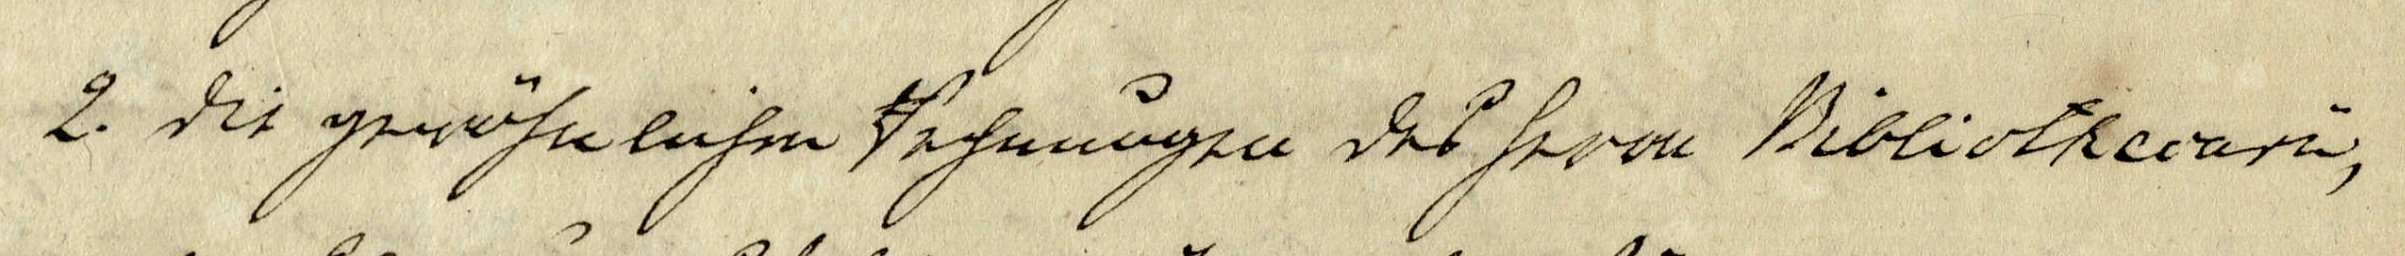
2. die gewöhnlichen Rechnungen des Herrn Bibliothecarii,
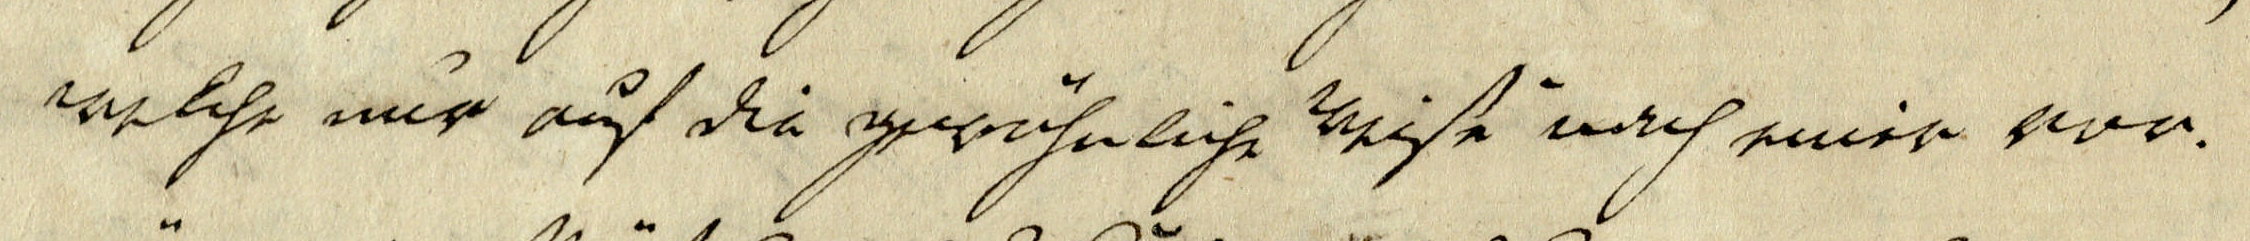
welche nur auf die gewöhnliche Weise nach einer vor¬
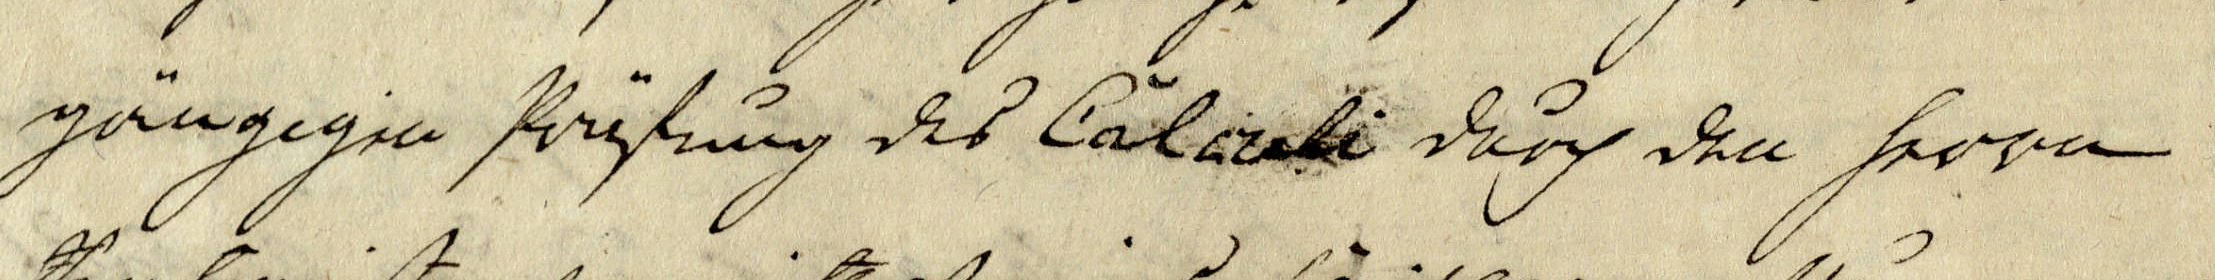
gängigen Prüfung des Calculi durch den Herrn
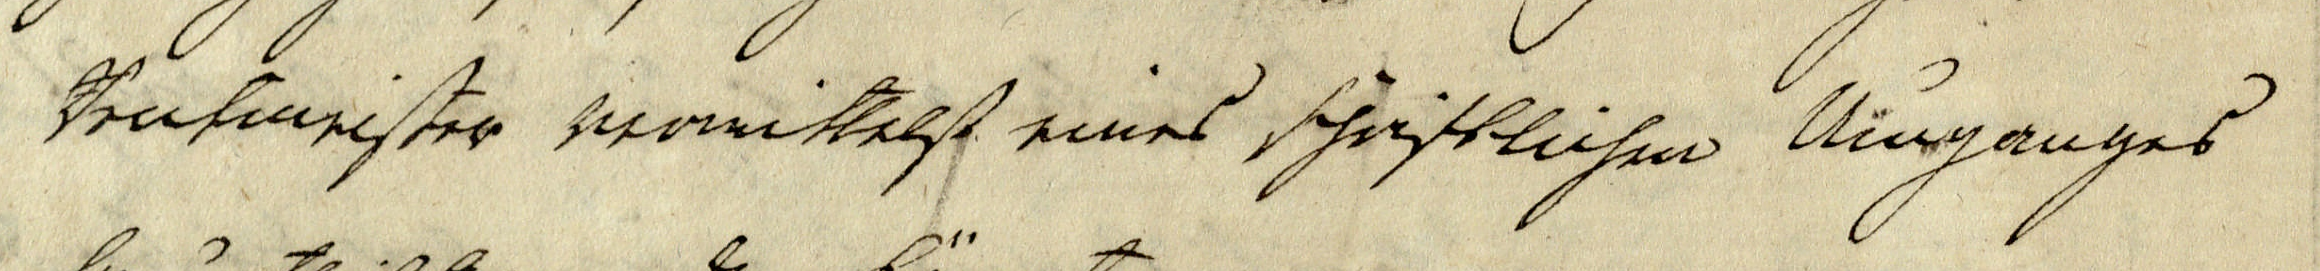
Rentmeister vermittelst eines schriftlichen Umganges
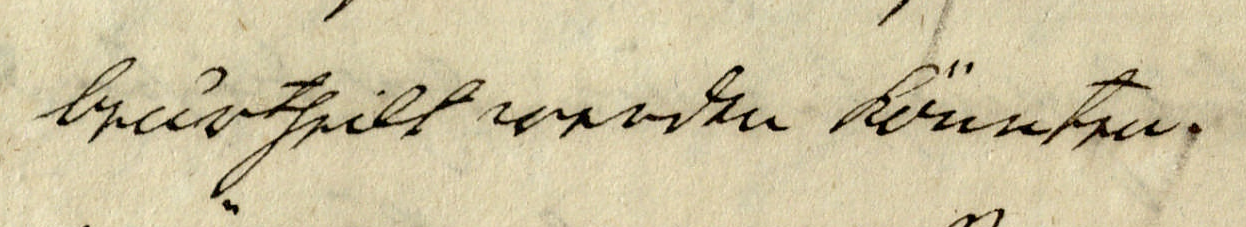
beurtheilt werden könnten.
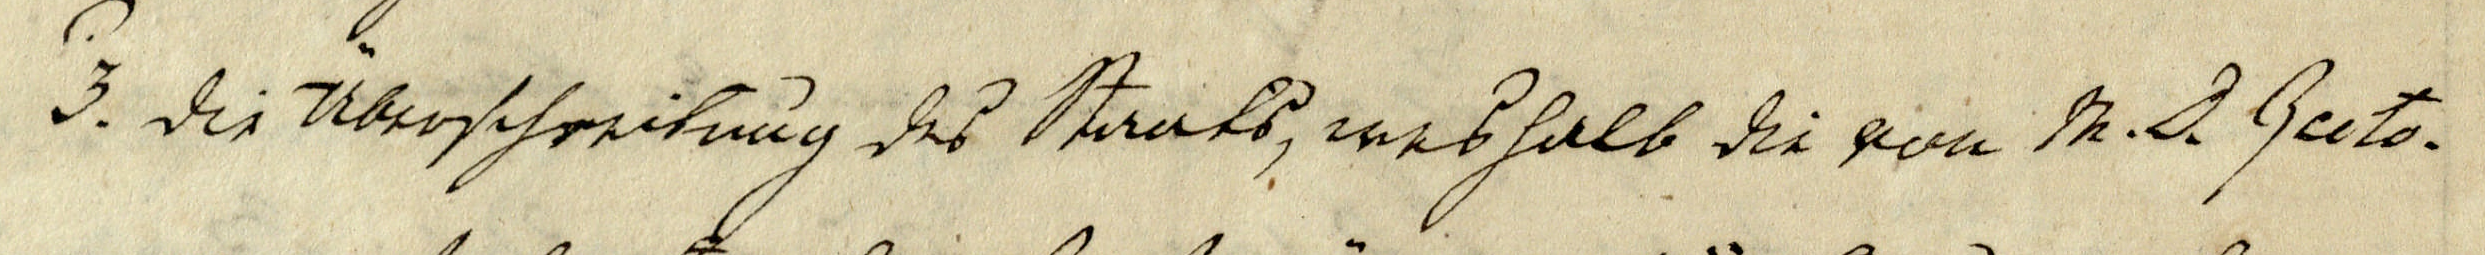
3. die Überschreitung des Staats, weshalb die von M. D. Recto¬
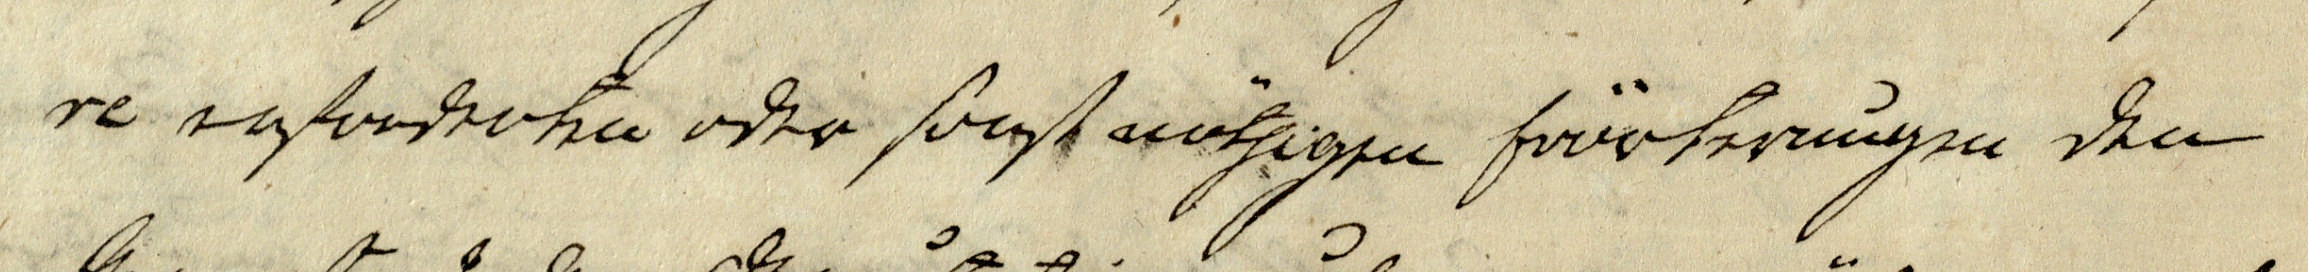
re erforderten oder sonst nöthigen Erörterungen den
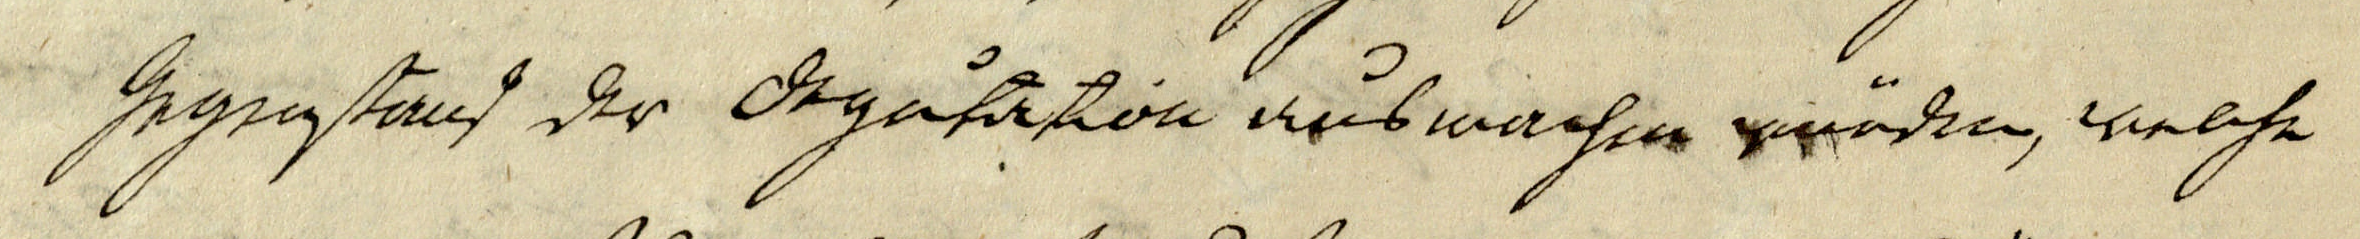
Gegenstand der Deputation ausmachen würden, welche
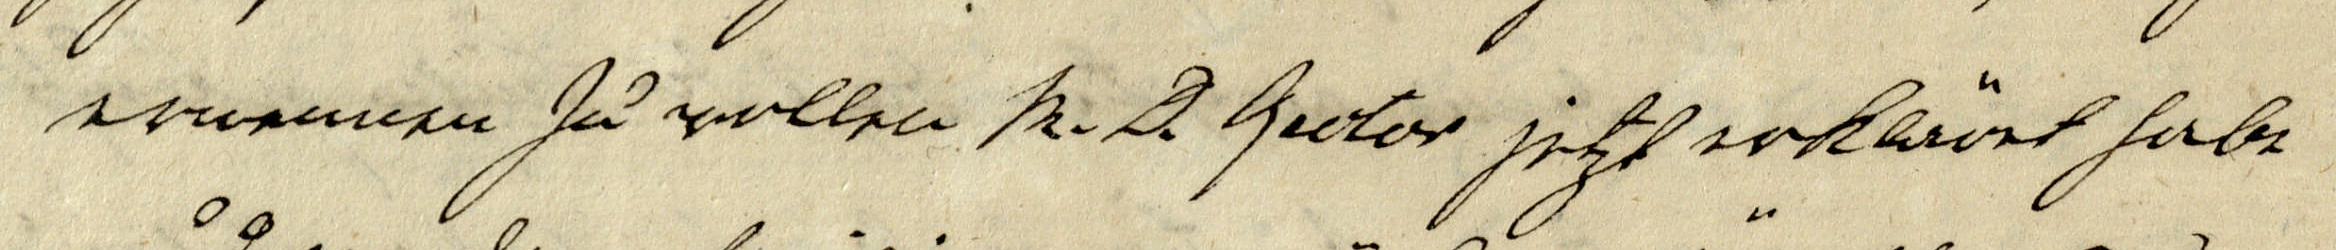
ernennen zu wollen M. D. Rector jetzt erkläret habe
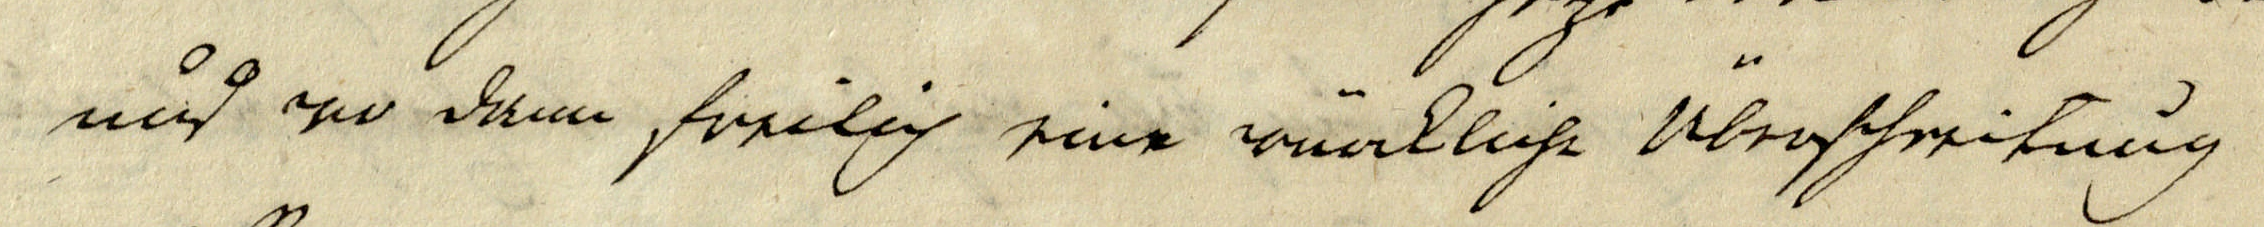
und wo dann freilich eine würckliche Überschreitung
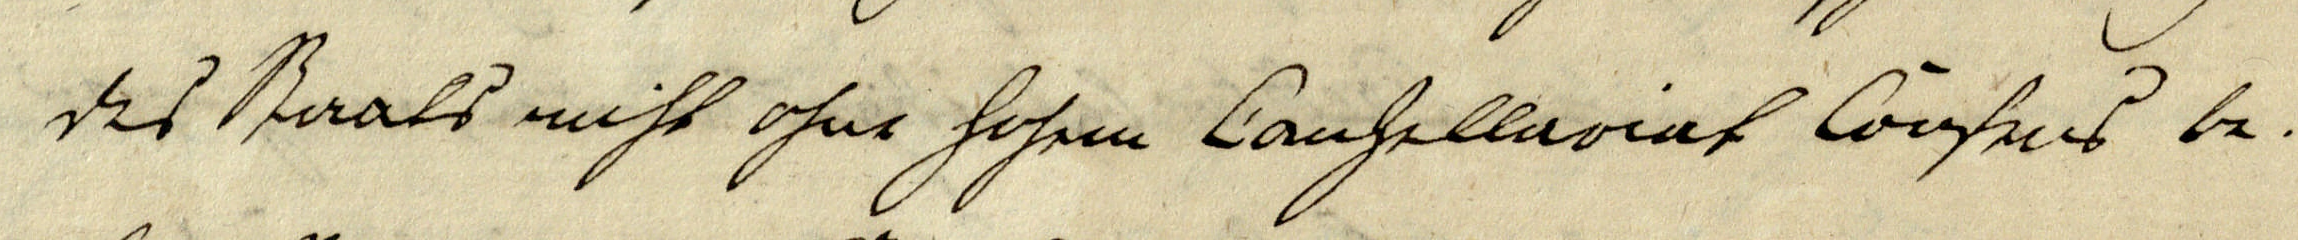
des Staats nicht ohne hohen Canzellariat Consens be¬
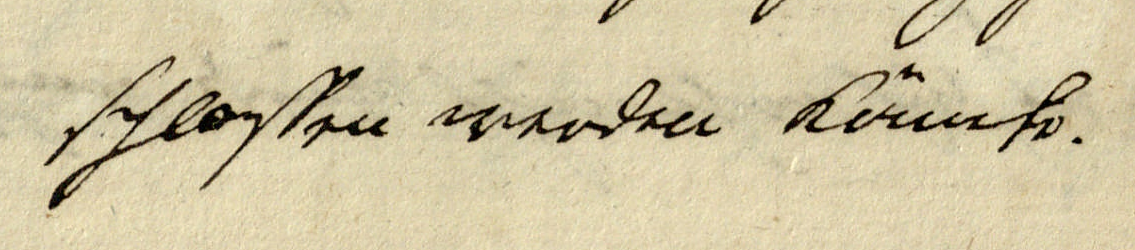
schlossen werden könnte.
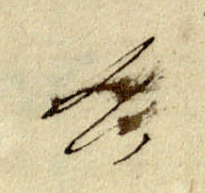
4.
